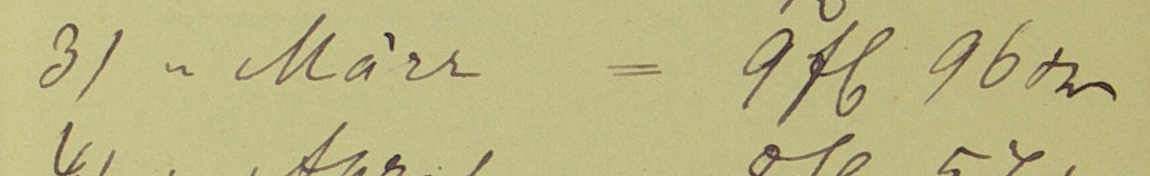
3.) * März = 9 * 96 *
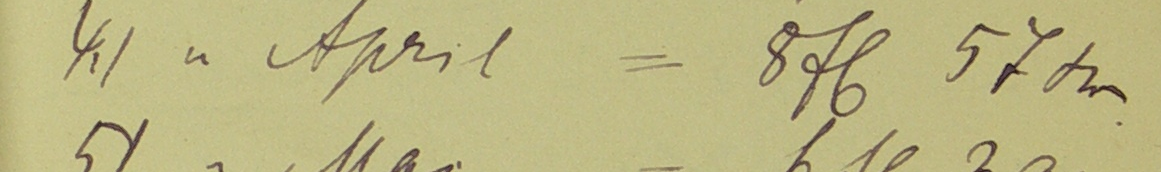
4.) * April = 8 * 57 *
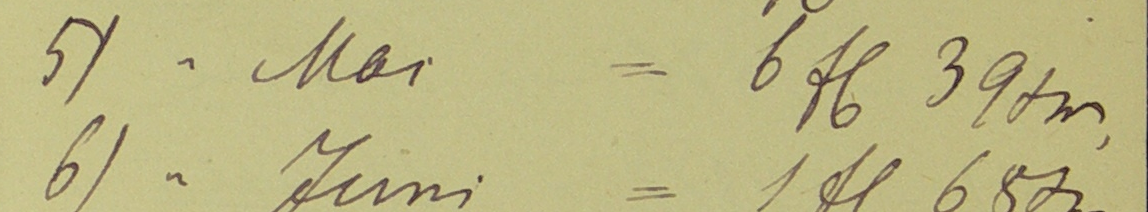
5.) * Mai = 6 * 39 *
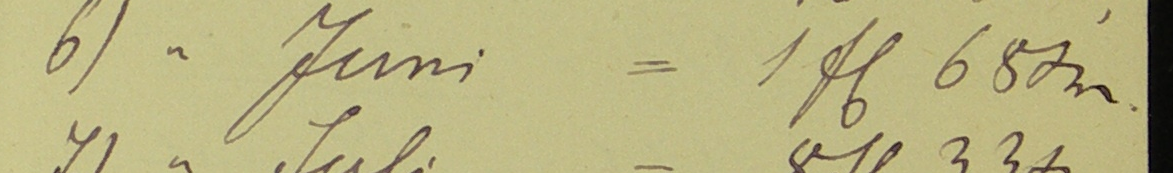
6.) * Juni = 1 * 68 *
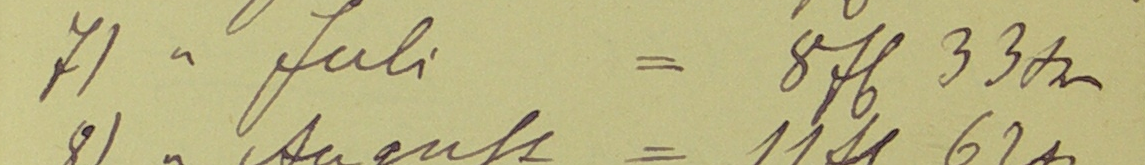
7.) * Juli = 8 * 33 *
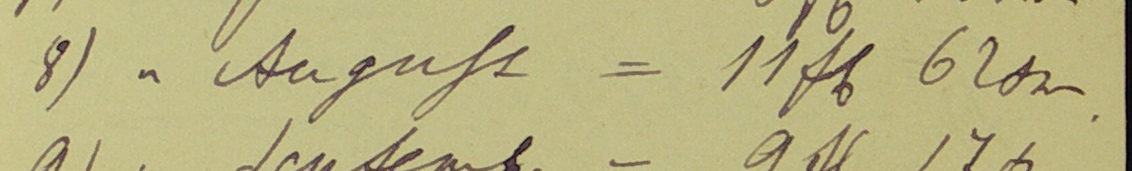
8.) * August = 11 * 62 *
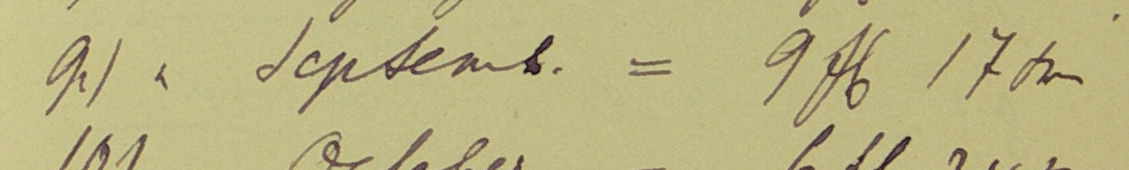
9.) * Septem. = 9 * 17 *
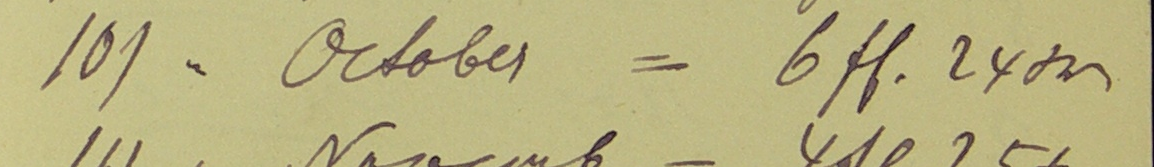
10.) * Octob. = 6 * 24 *
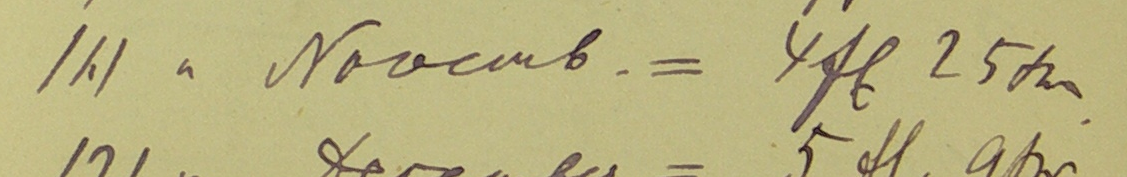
11.) * Novem. = 4 * 25 *
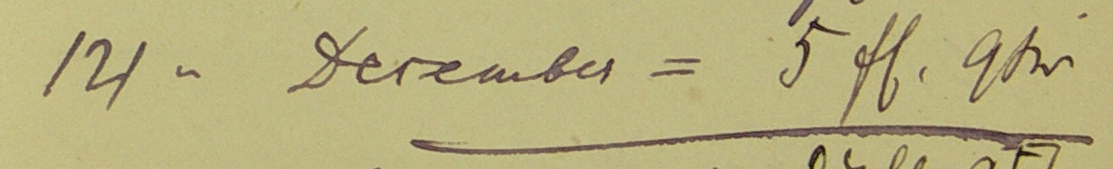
12.) * December = 5 * 9 *
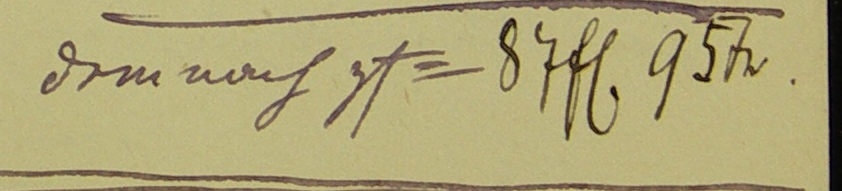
Demnach zusammen = 87 * 95 *
